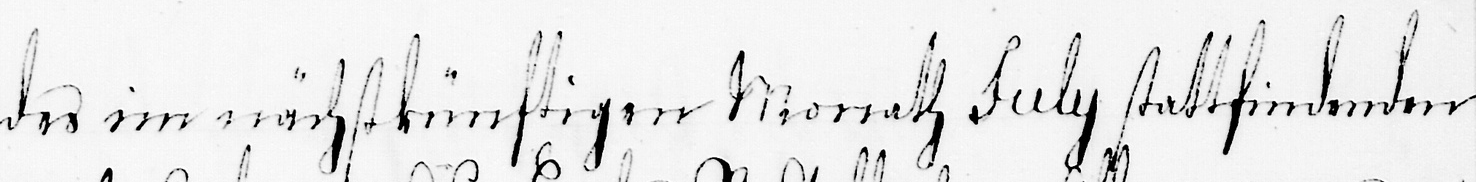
des im nächstkünftigen Monath July stattfindenden
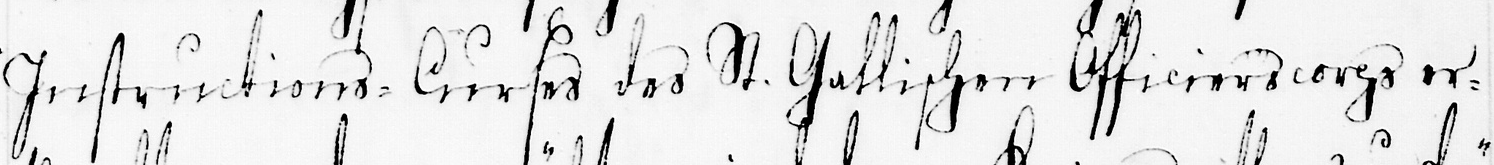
Instructions-Curses des St. Gallischen Officierscorps er¬
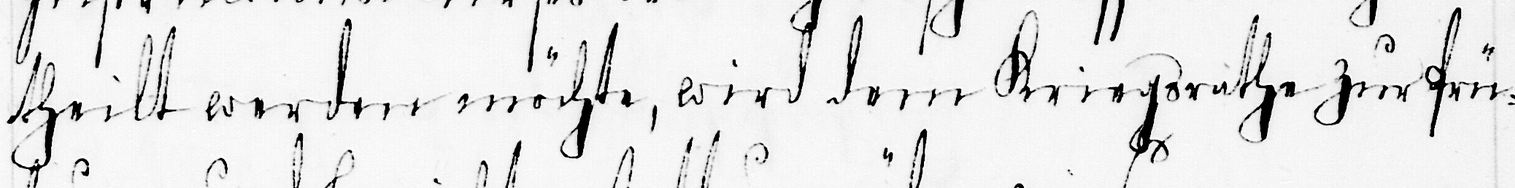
theilt werden möchte, wird dem Kriegsrathe zur Prü¬
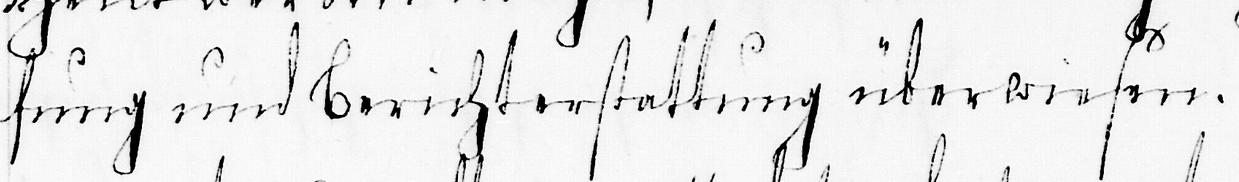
fung und Berichterstattung überwiesen.
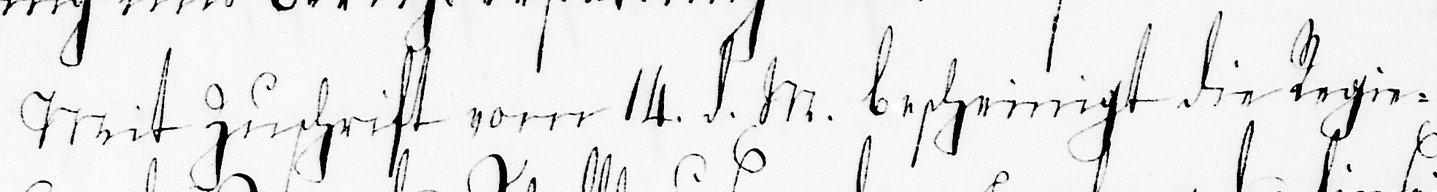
Mit Zuschrift vom 14. d. M. bescheinigt die Regie¬
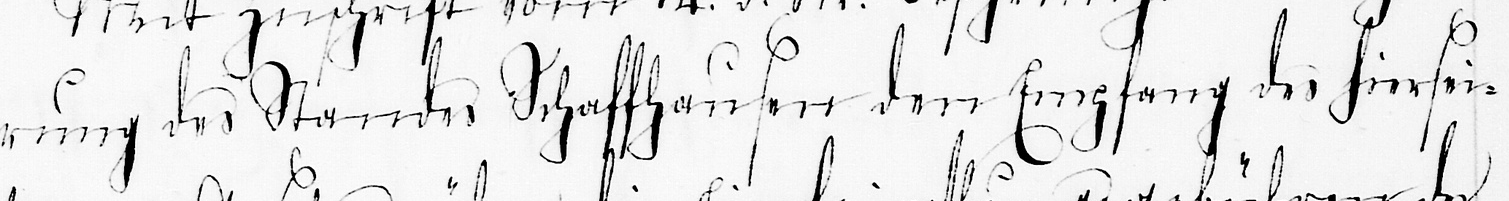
rung des Standes Schaffhausen den Empfang des hiersei¬
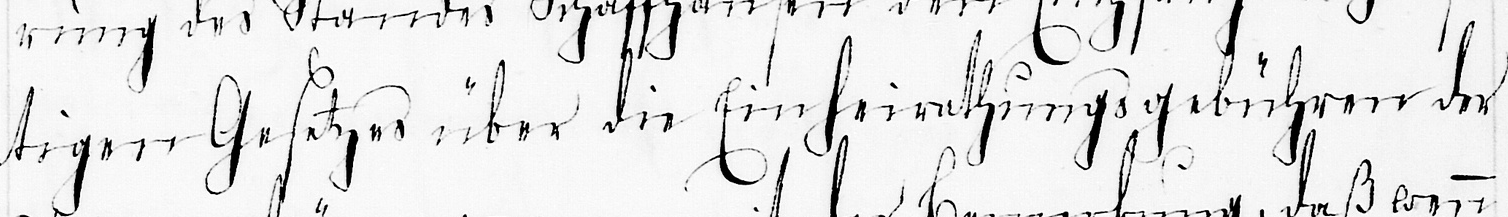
tigen Gesetzes über die Einheirathungsgebühren der
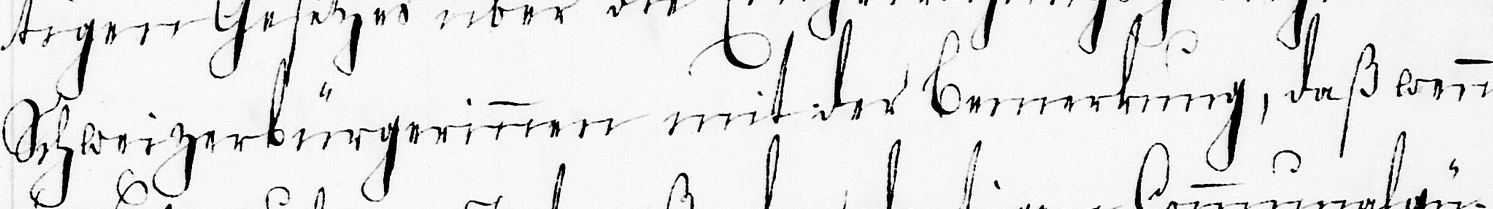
Schweizerbürgerinnen mit der Bemerkung, daß wenn
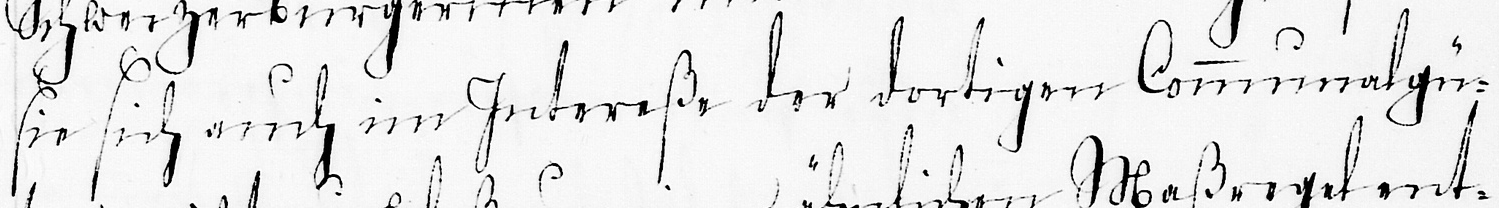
sie sich auch im Intereße der dortigen Communalgü¬
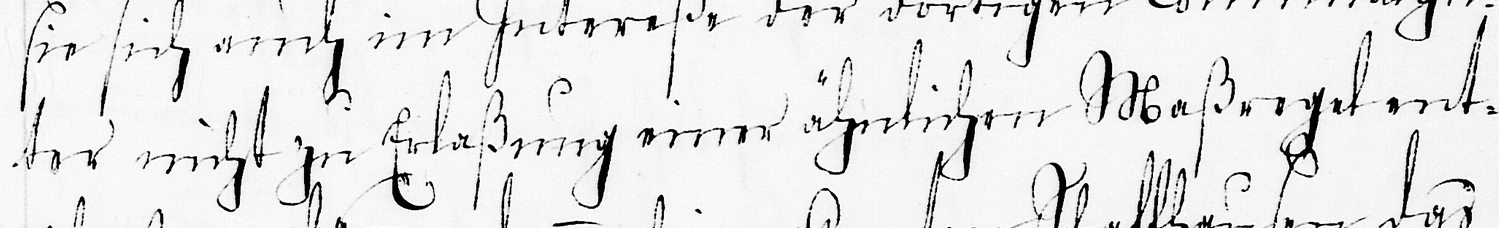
ter nicht zu Erlaßung einer ähnlichen Maßregel ent¬
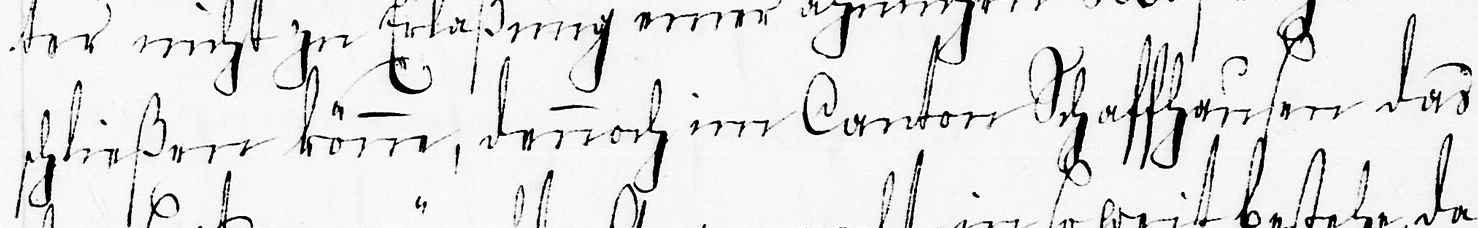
schließen könne, dennoch im Canton Schaffhausen das
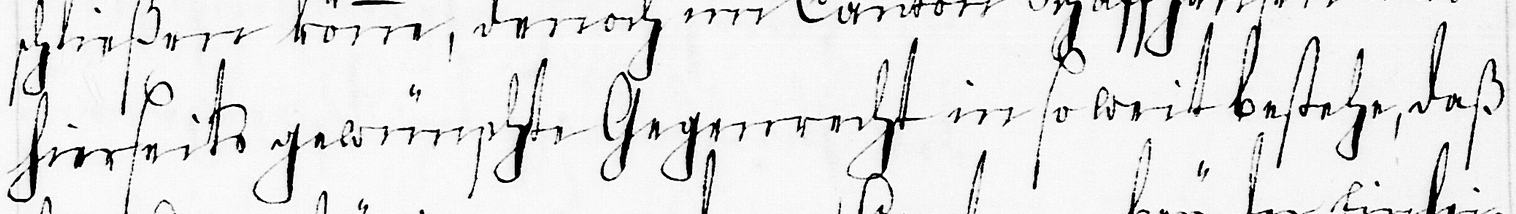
hierseits gewünschte Gegenrecht in so weit bestehe, daß
